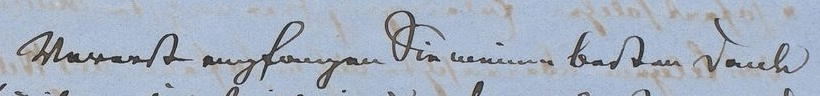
Vorerst empfangen Sie meinen besten Dank
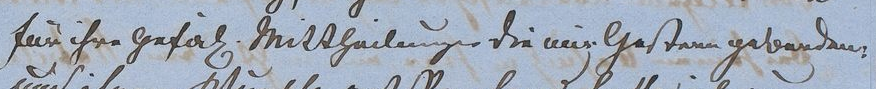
für ihre gefäll. Mittheilungen die mir Gestern geworden;
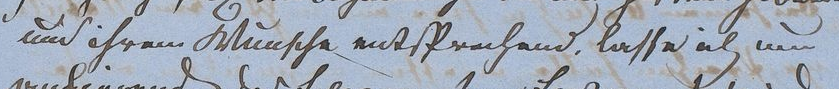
und ihrem Wunsche entsprchend, lasse ich nun
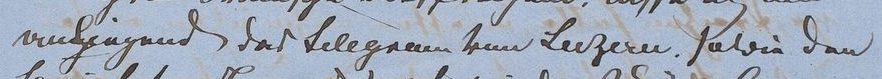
anlgiegend das Telegram von Luzern sowie den
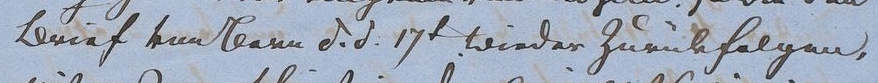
Brief von Bern d. d. 17t wieder zurükfolgen,
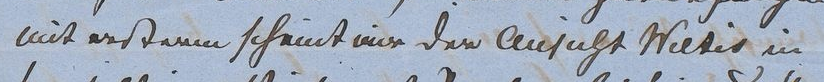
mit ersterm scheint mir der Ansicht Weltis in
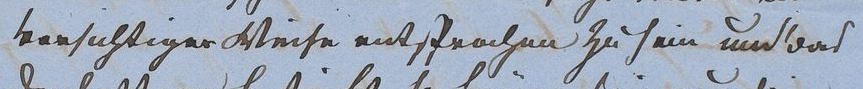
vorsichtiger Weise entsprochen zu sein und was
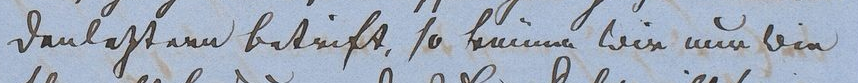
den leztern betrift, so können wir nur wie
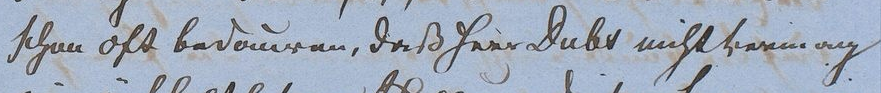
schon oft bedauren, daß Herr Dubs nicht vermag
